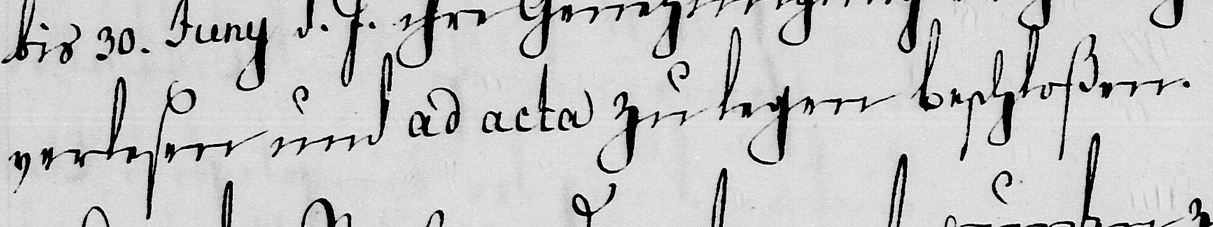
verlesen und ad acta zu legen beschloßen.
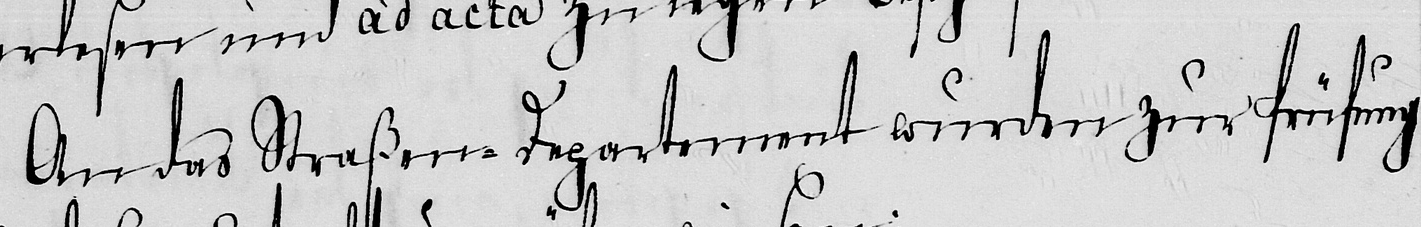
An das Straßen-Departement wurden zur Prüfung
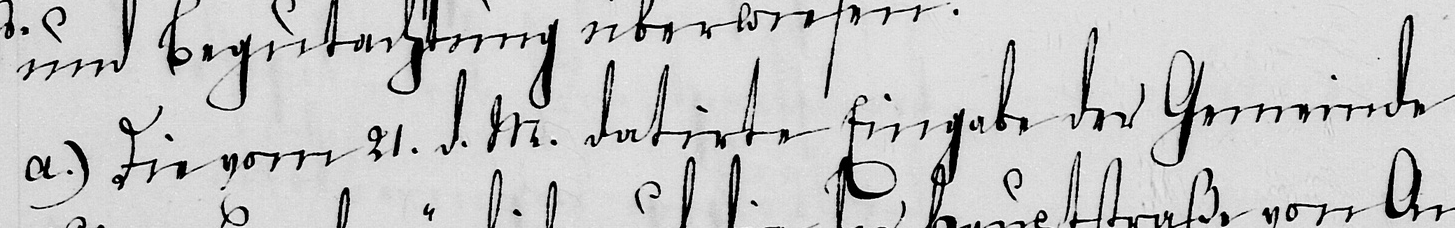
a.) Die vom 21. d. M. datirte Eingabe der Gemeinde
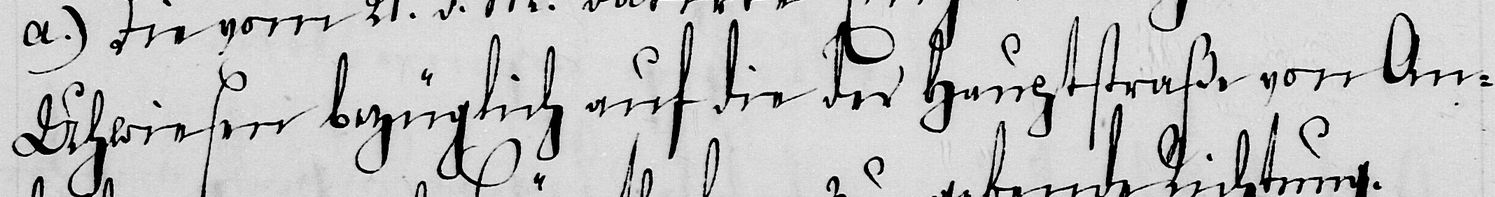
Uhwiesen bezüglich auf die der Hauptstraße von An¬
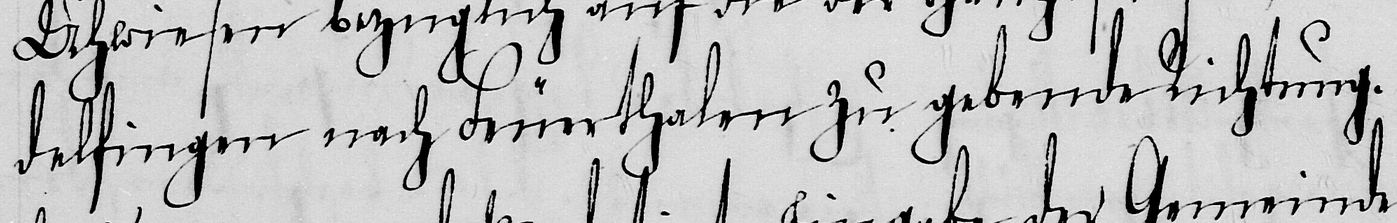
delfingen nach Feuerthalen zu gebende Richtung.
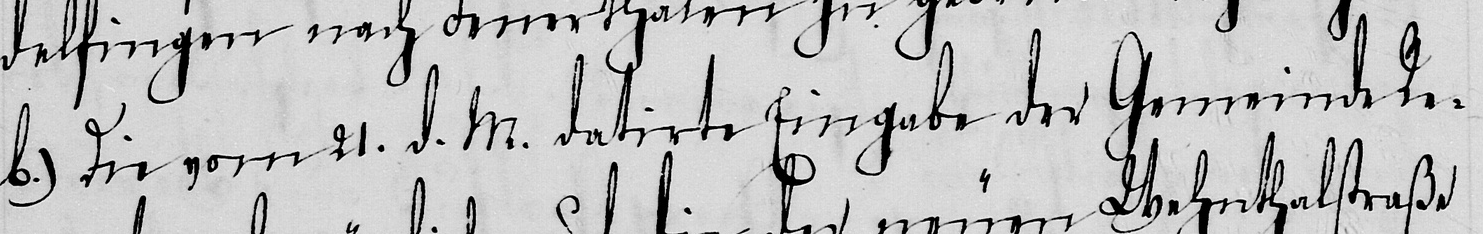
b.) Die vom 21. d. M. datirte Eingabe der Gemeinde Re¬
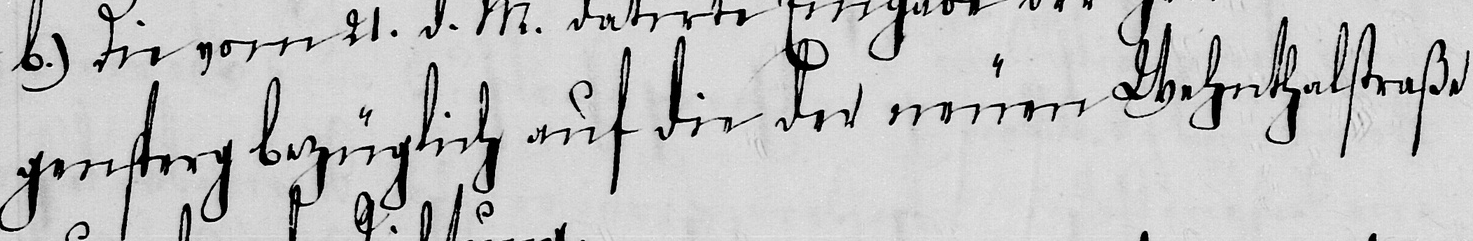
gensperg bezüglich auf die der neuen Wehnthalstraße
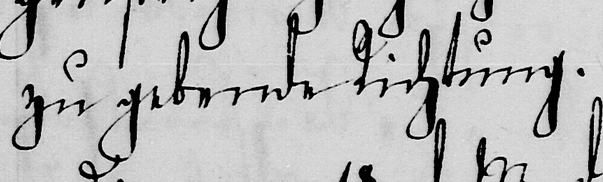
zu gebende Richtung.
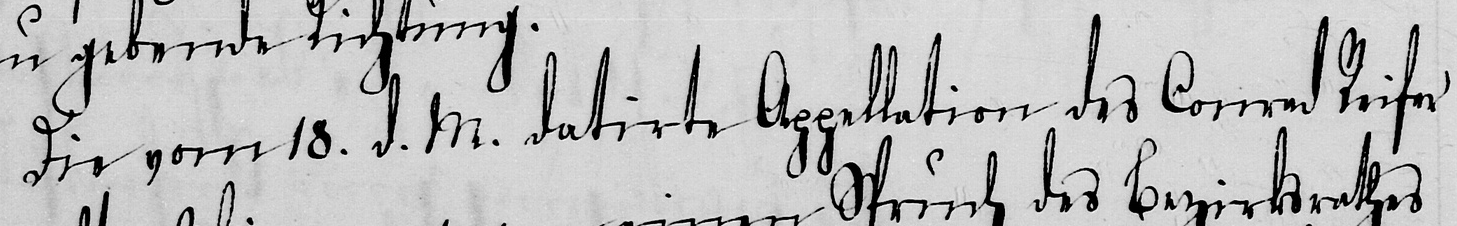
Die vom 18. d. M. datirte Appellation des Conrad Reifer
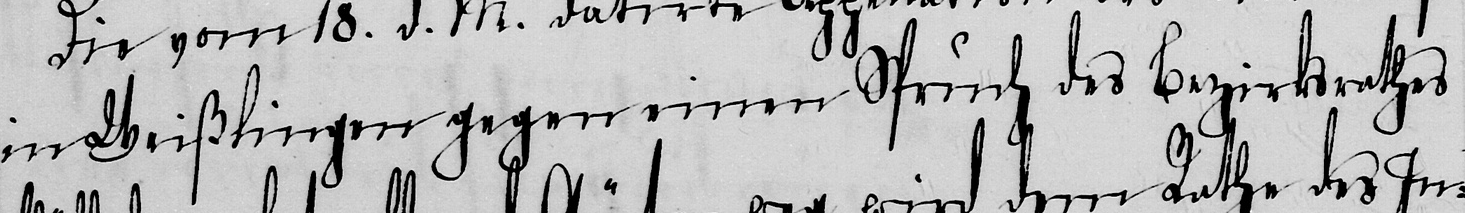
in Weißlingen gegen einen Spruch des Bezirksrathes
